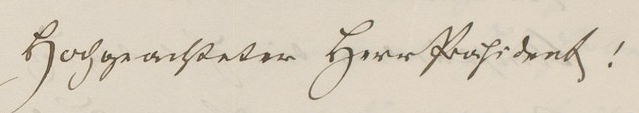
Hochgeachteter Herr Präsident!
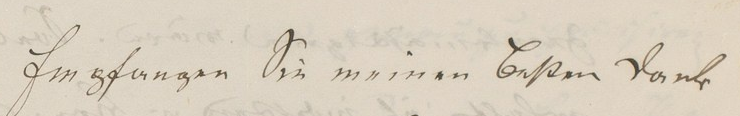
Empfangen Sie meinen besten Dank
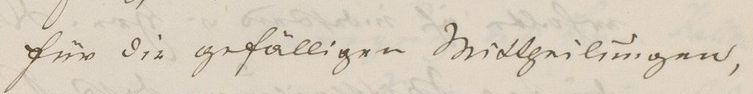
für die gefälligen Mittheilungen,
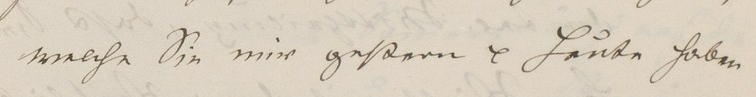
welche Sie mir gestern & heute haben
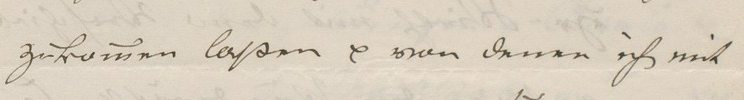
zukommen laßen & von denen ich mit
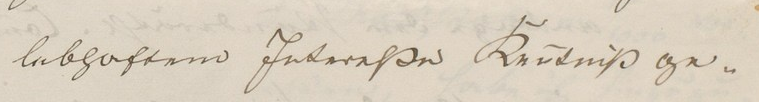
lebhaftem Intereße Kenntniß ge-
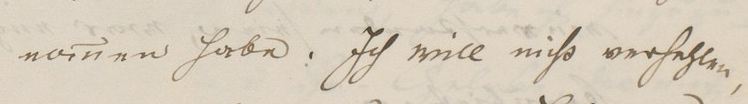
nommen habe: Ich will nicht verhehlen,
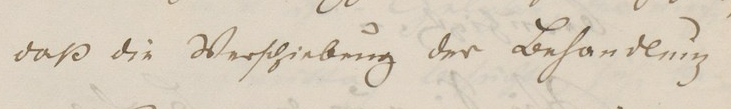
daß die Verschiebung der Behandlung
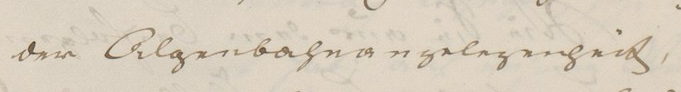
der Alpenbahnangelegenheit,
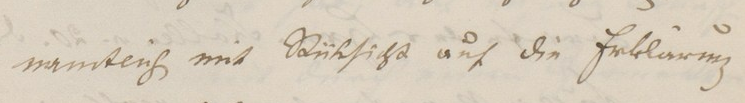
namtlich mit Rüksicht auf die Erklärung
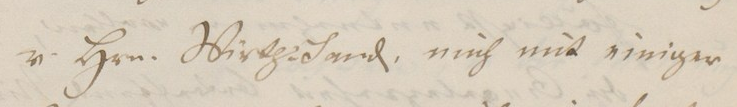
v. Hrn. Wirth-Sand, mich mit einiger
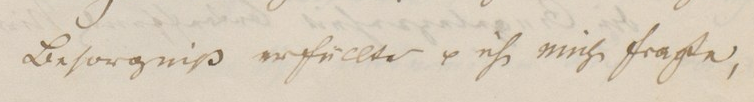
Besorgniß erfüllte & ich mich fragte,
